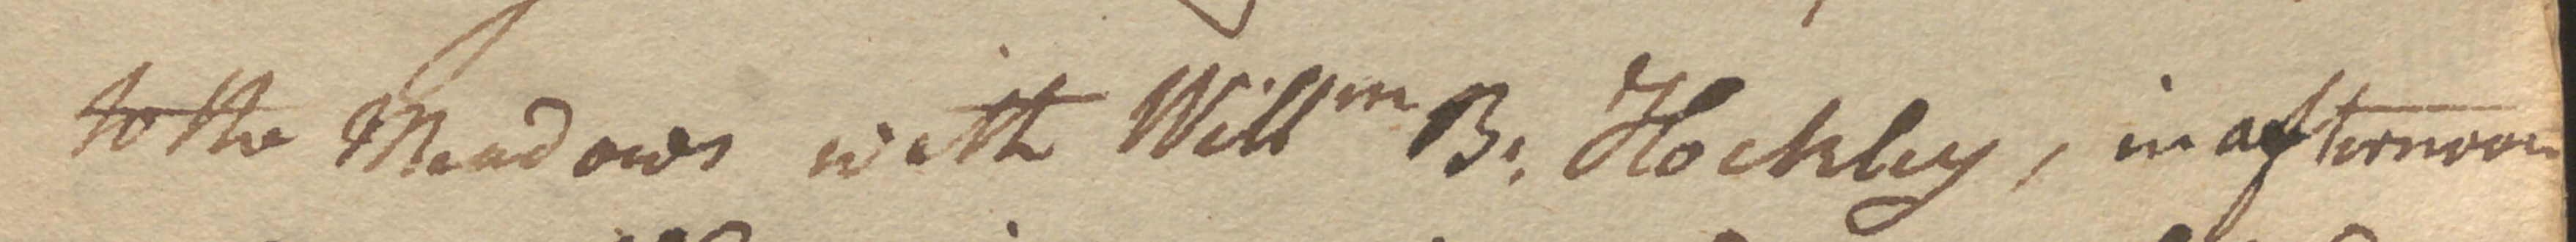to the Meadows with Will^m B. Hockley, in afternoon
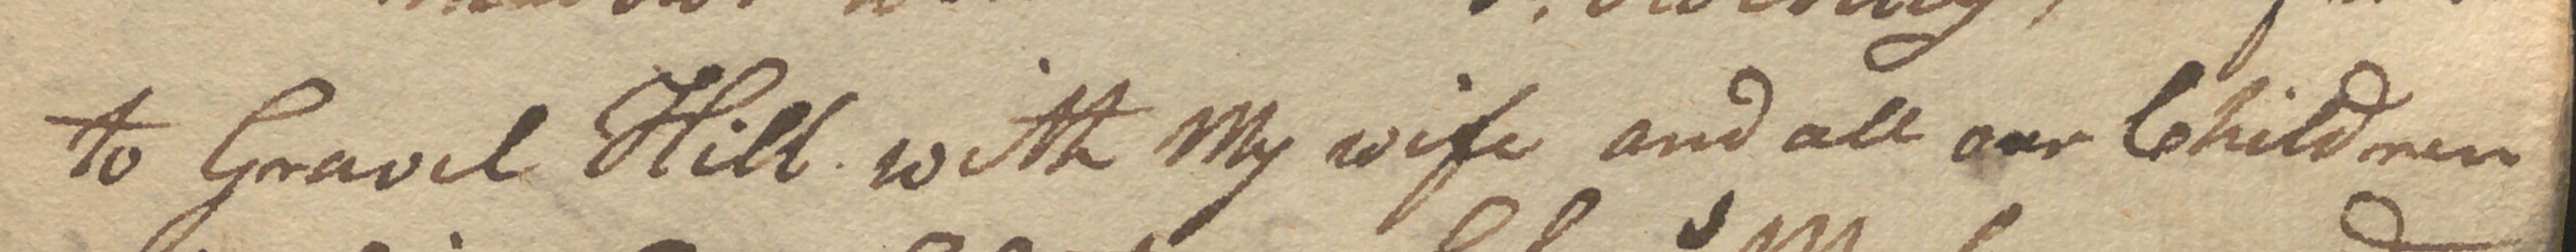to Gravel Hill with My wife and all our Children
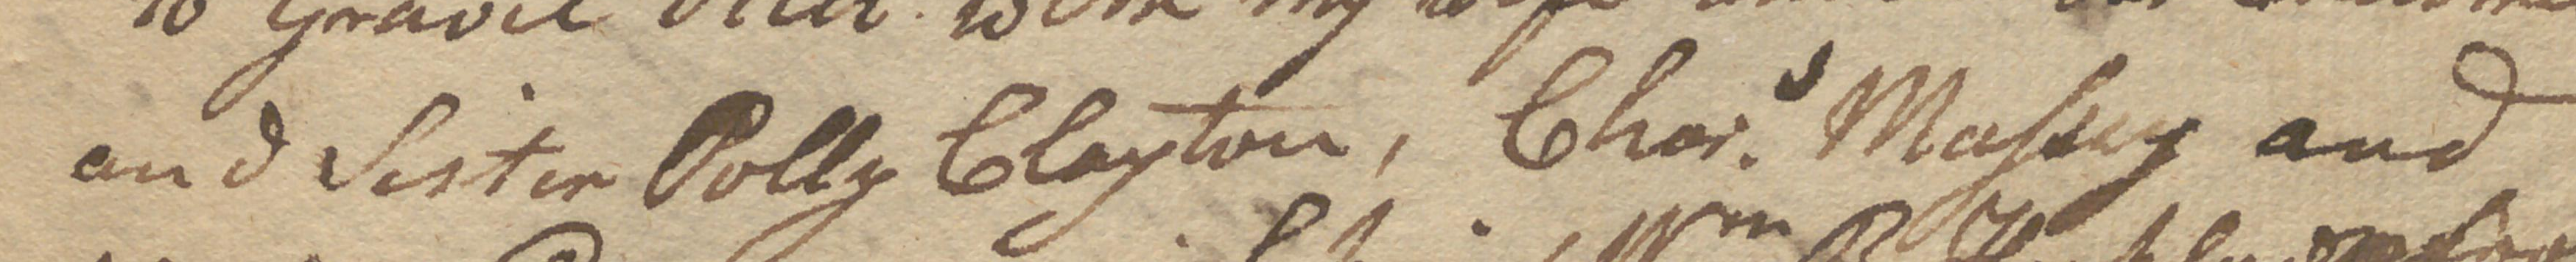and Sister Polly Clayton, Char^s. Massey and
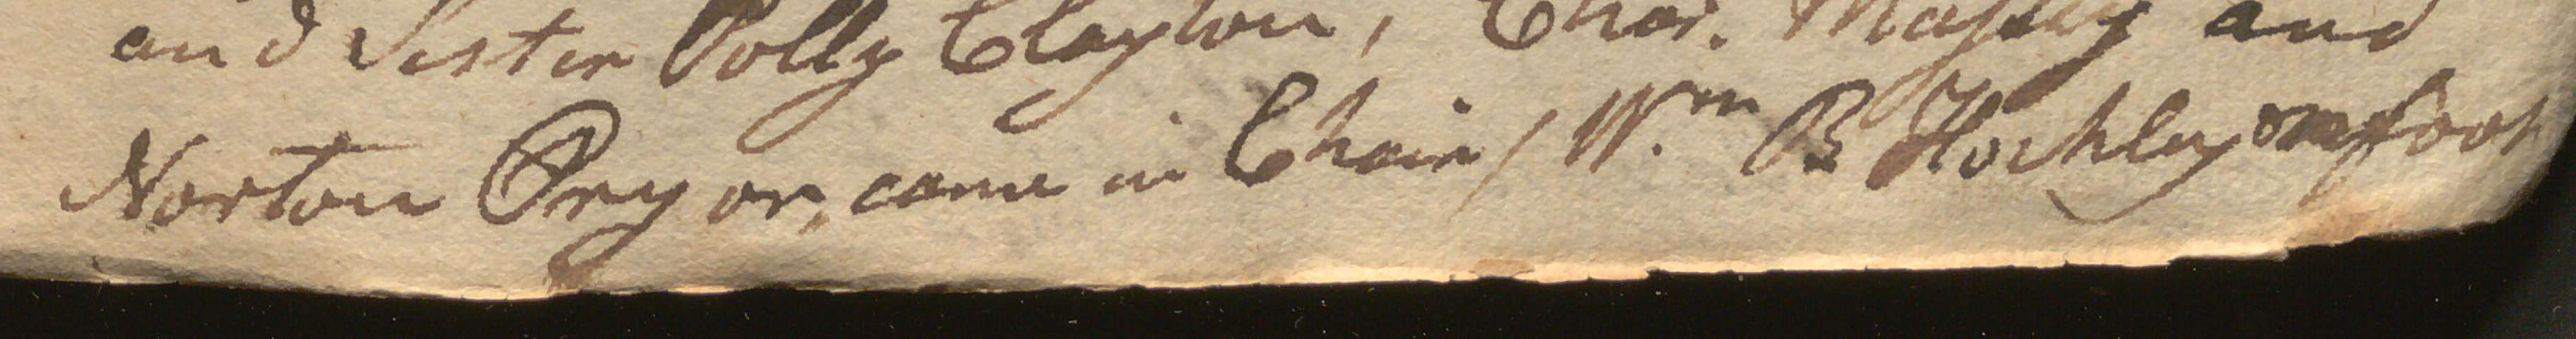Norton Pryon came in Chair / M^r. B. Hockly on foot
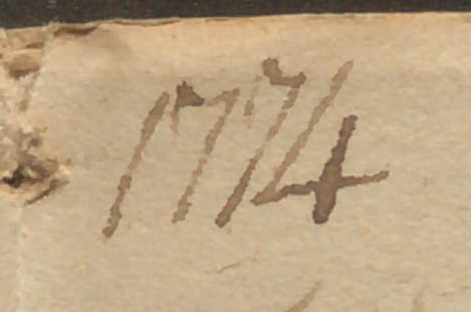1774
